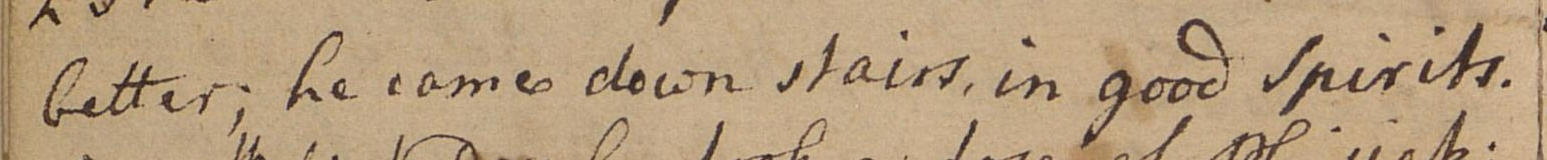better; he came down stairs in good Spirits.
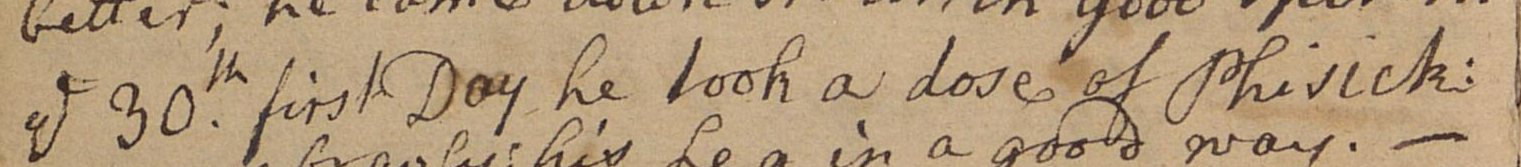y^e 30^th. first Day he took a dose of Phisick:
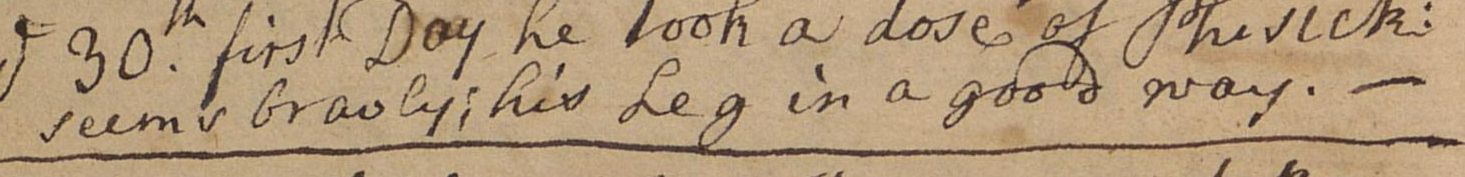seems bravly; his Leg in a good way.-
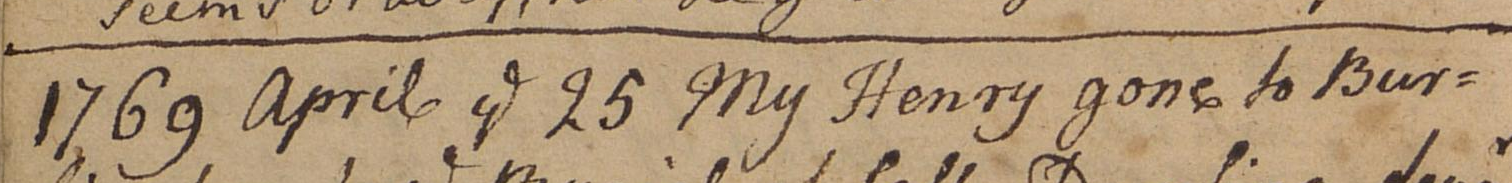1769 April y^e 25 My Henry gone to Bur-
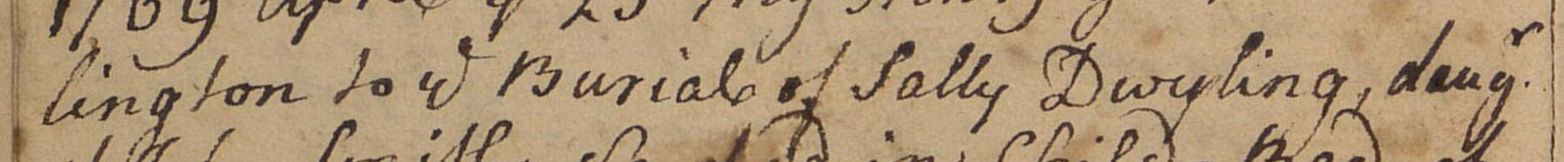lington to y^e Burial of Sally Dwyling, daug^r
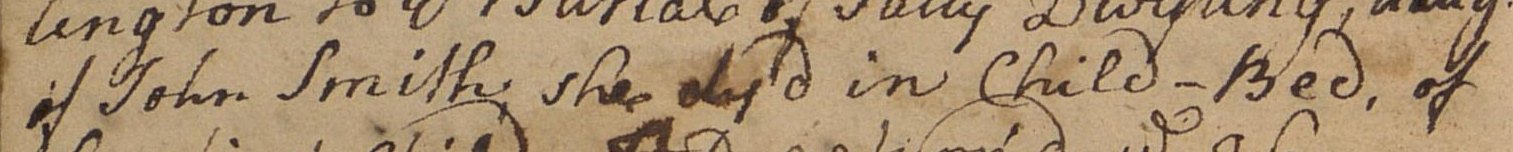of John Smith, she Ly'd in Child- Bed, of
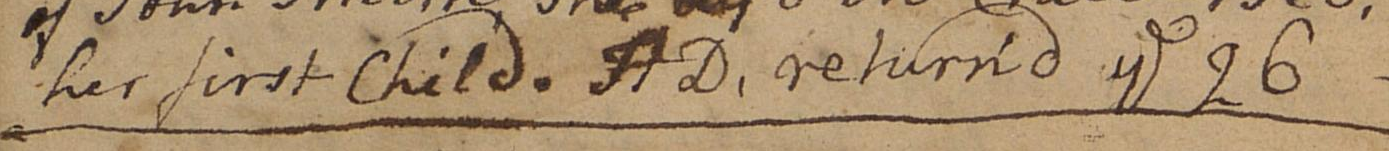her first Child. H D, return'd y^e 26
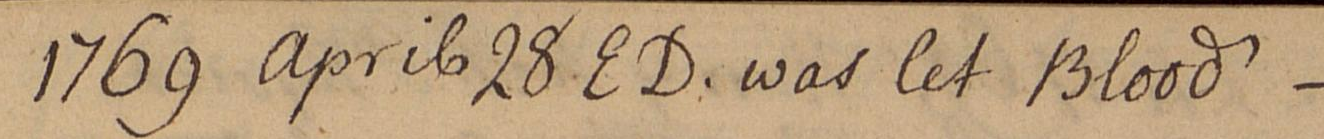1769 April 28 ED. was let Blood
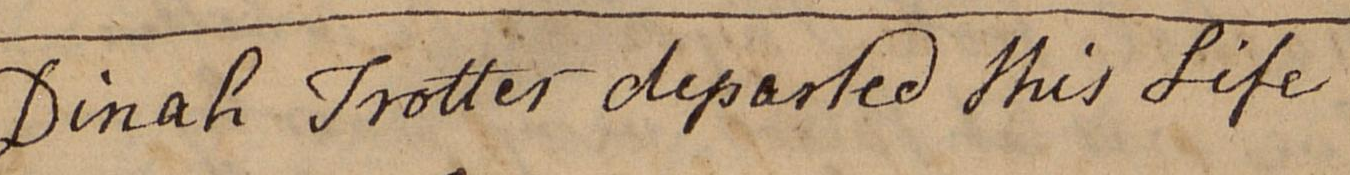Dinah Trotter departed this Life
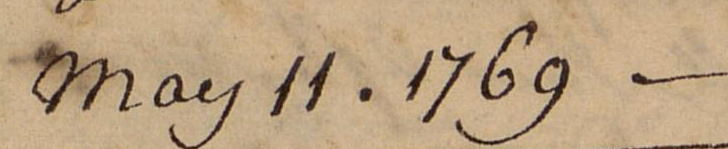May 11. 1769-
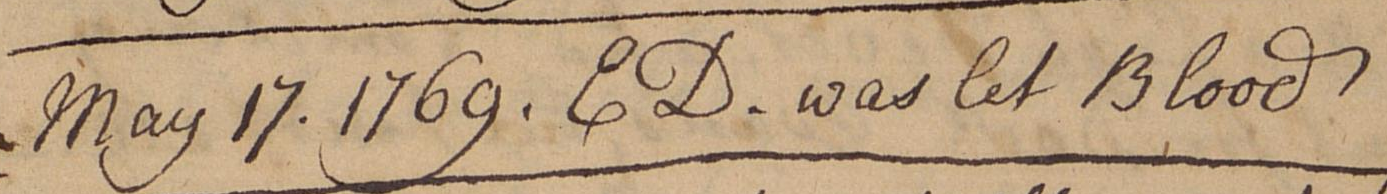May 17. 1769. E D. was let Blood
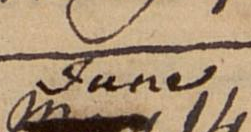June
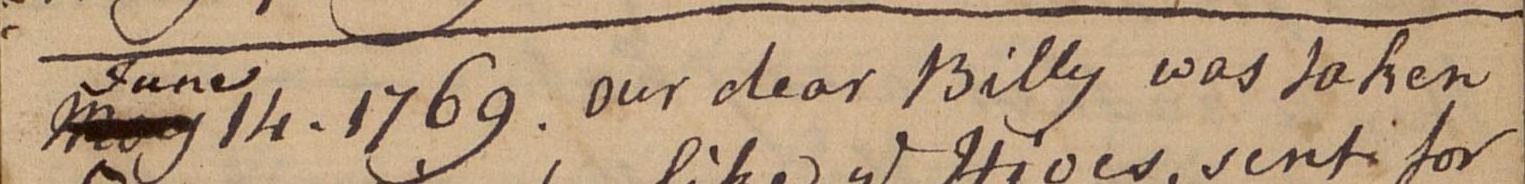[May] 14. 1769. our dear Billy was taken
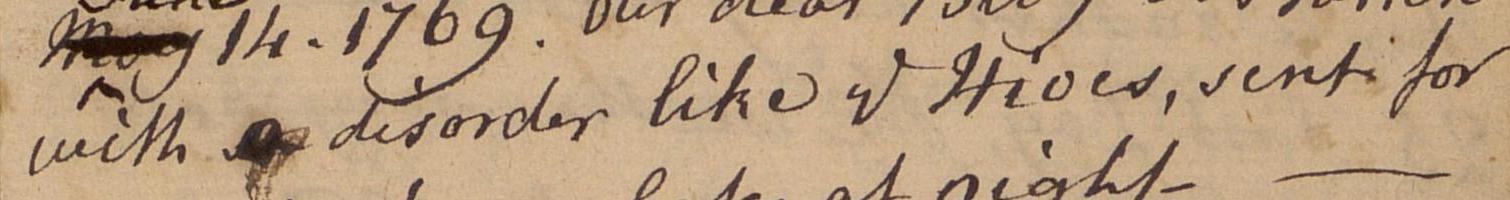with a disorder like y^e Hives, sent for
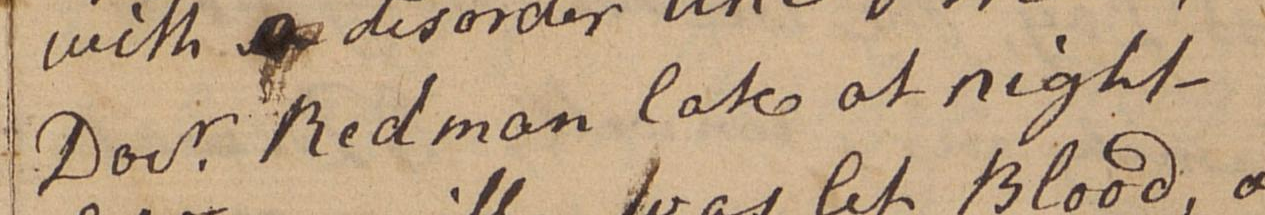Doc^r. Redman late at night-
